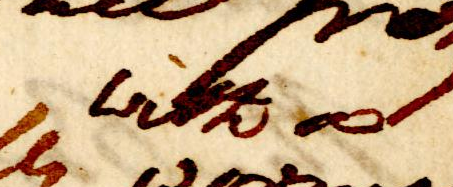with a
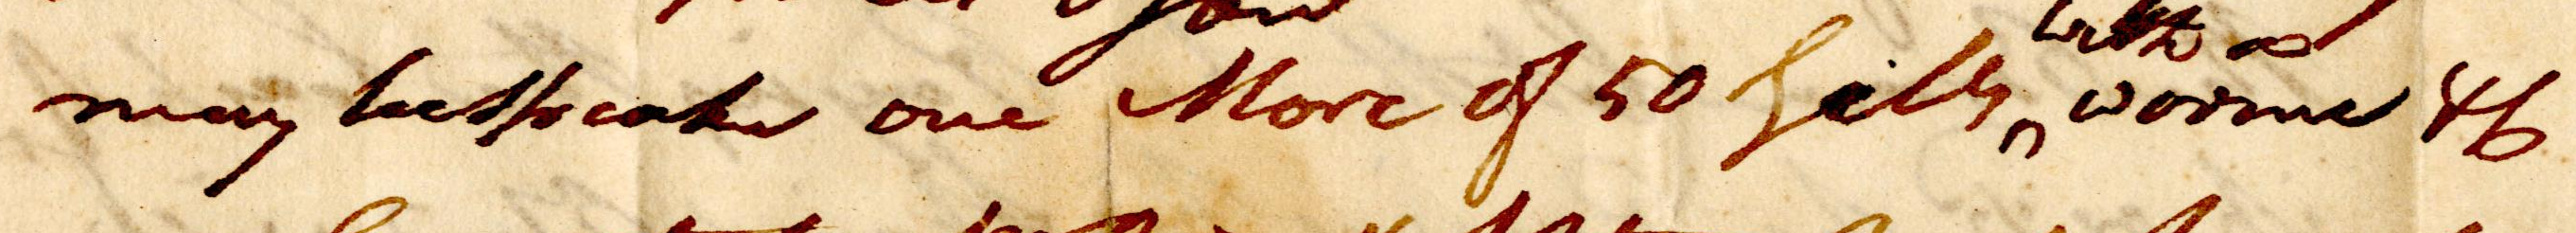may bespeake one More of 50 Gills ^ Worme &C
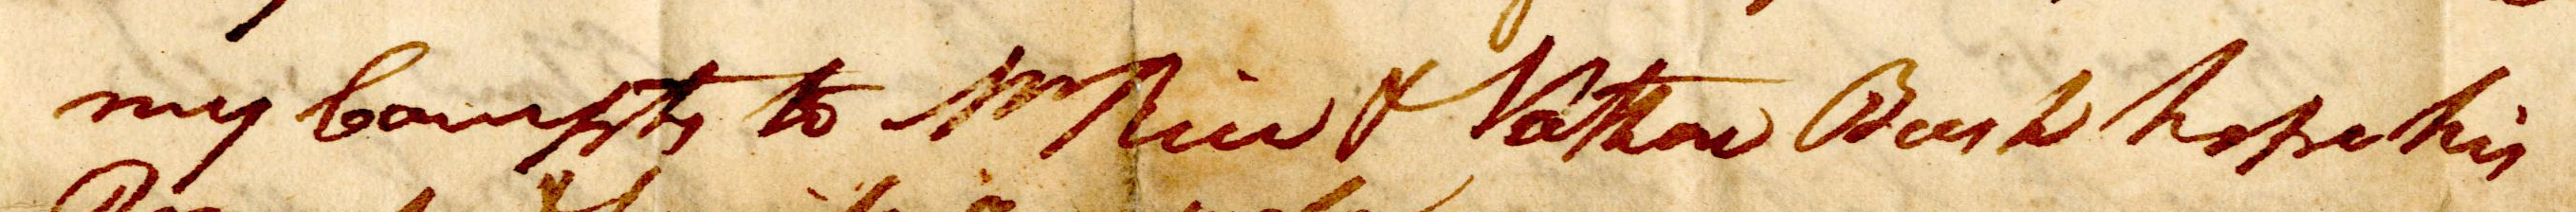my Comp^ts to M^r Rice & Nathan Bush hope his
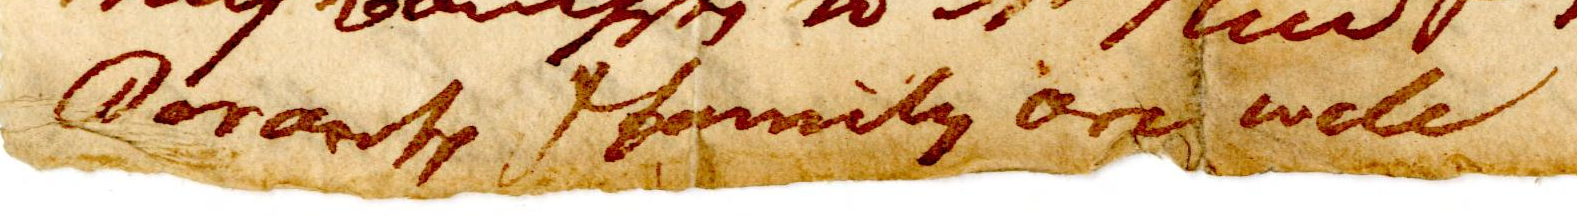Parants & Family are well
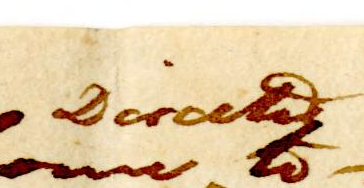Directed
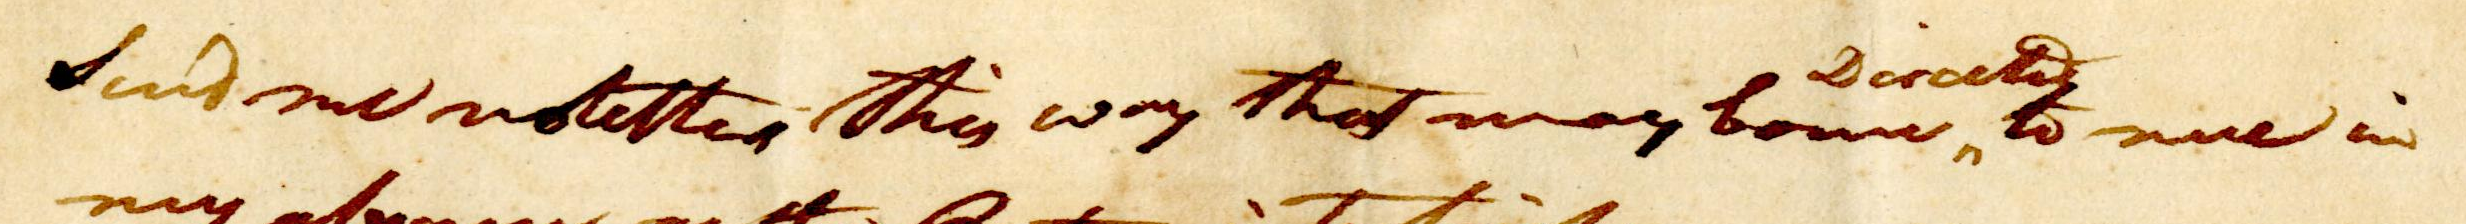Send me another this way that may become to mine in
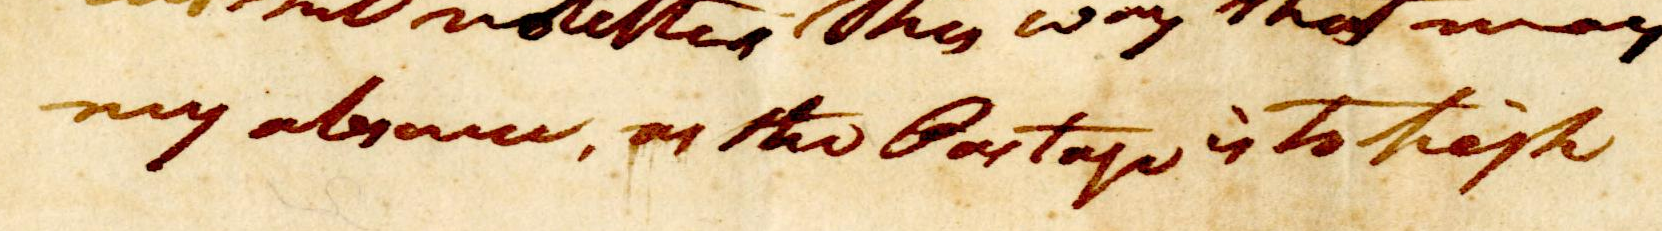my absence, as the Postage is to high
